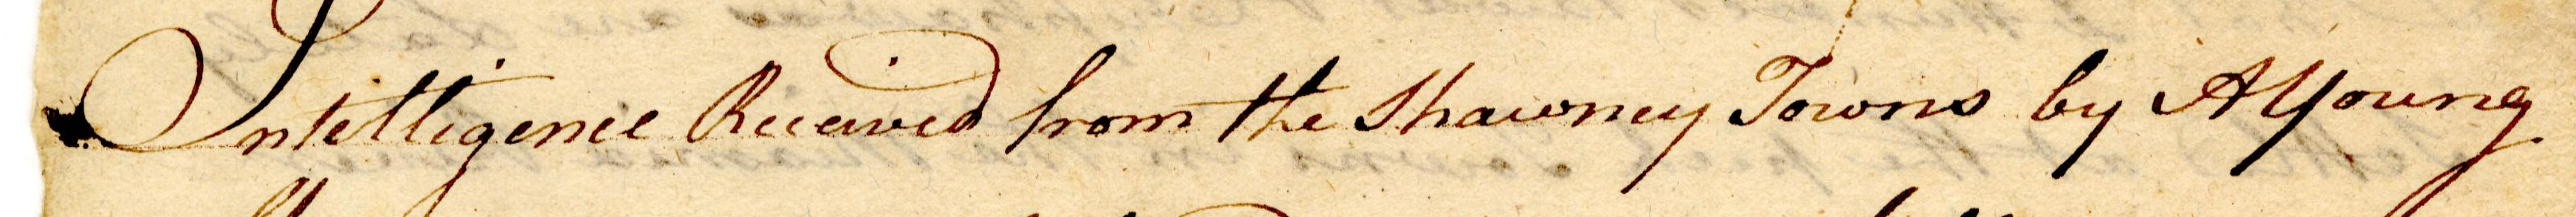Intilligence Received from the Shawney Towns by A young
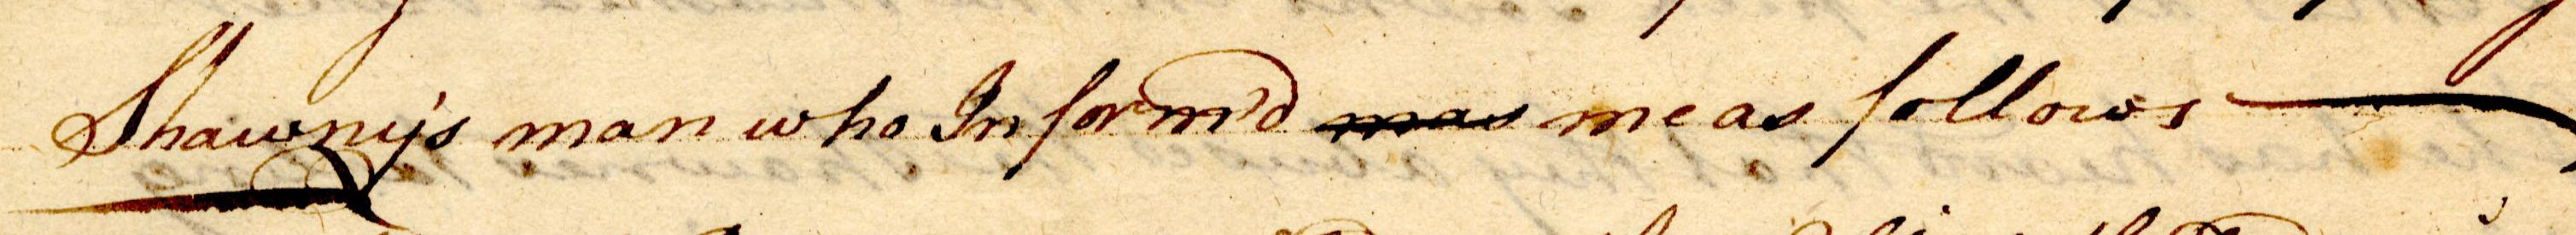Shawny's man who Inform'd [___] me as follows-
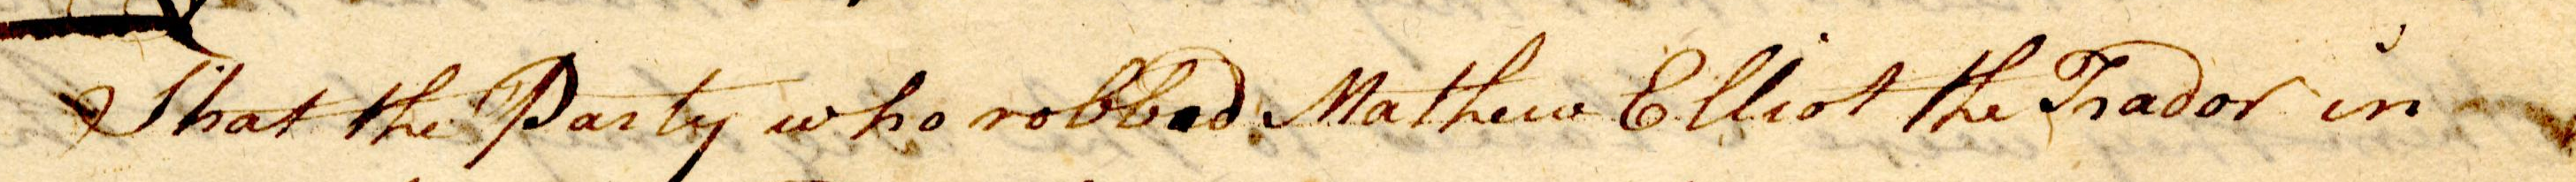That the Party who robbed Mathew Elliot the Trador in
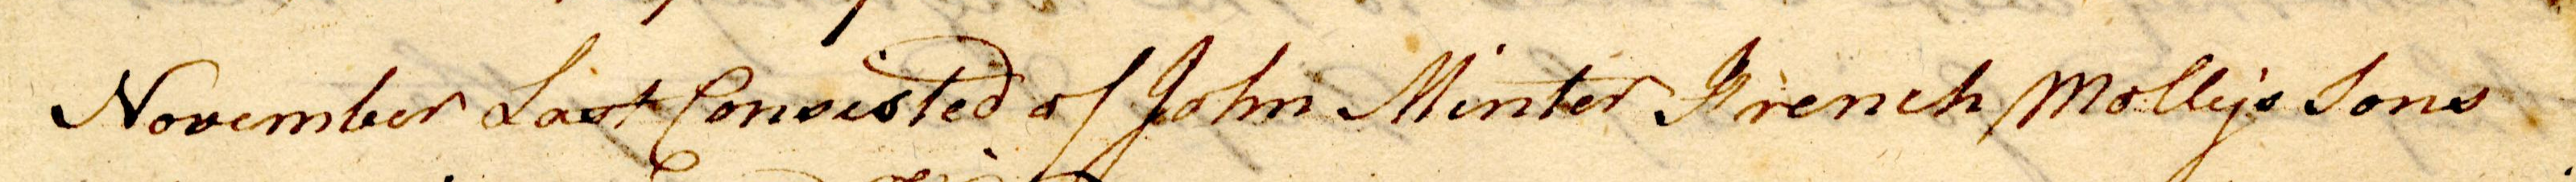November Last Consisted of John Monter French Molly's Sons
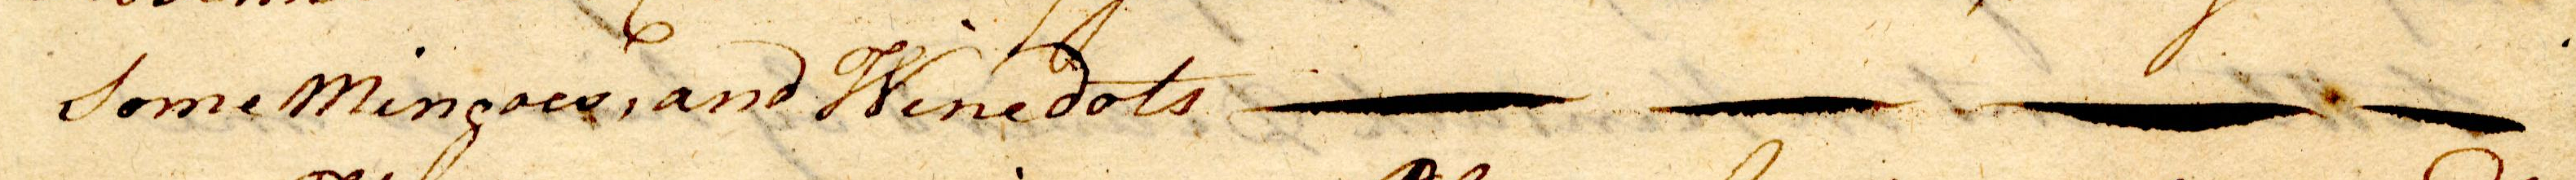some Mingoes, and Winedots-
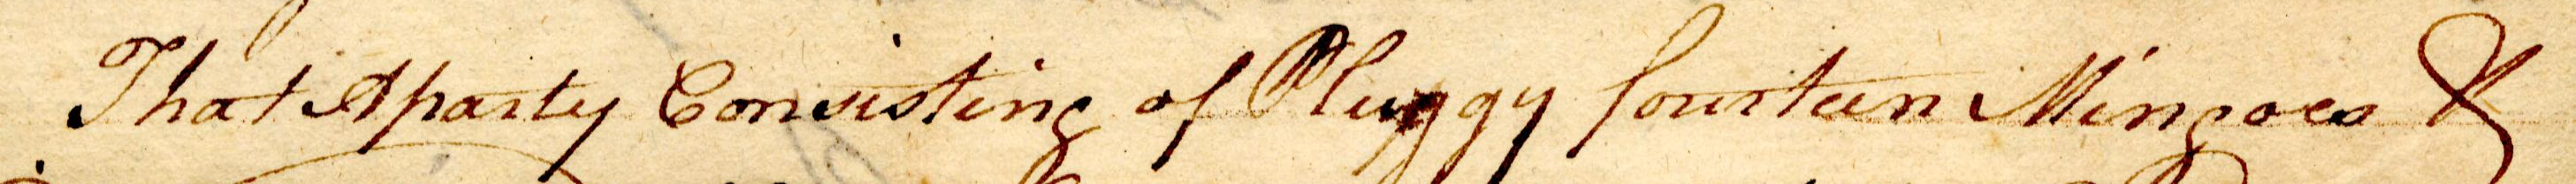That A party Consisting of Pluggy fourteen Mingoes &
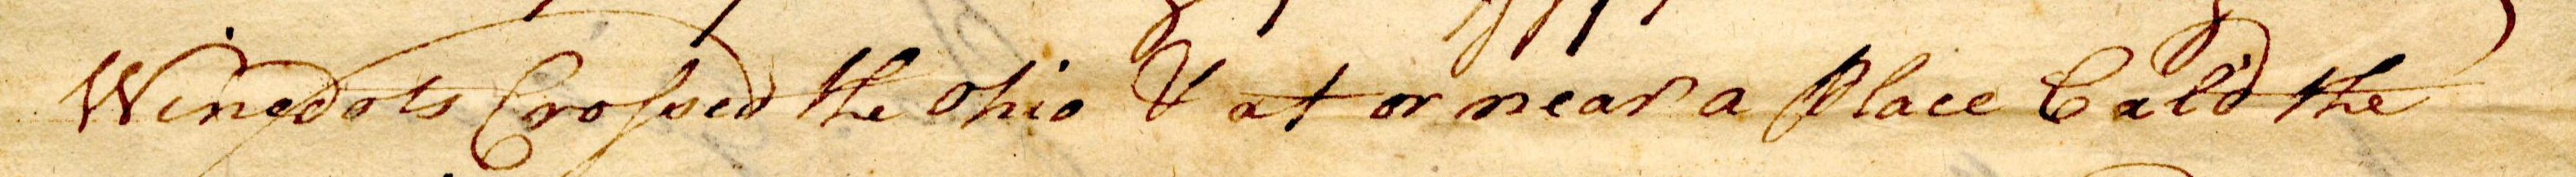Winedots Crossed the Ohio & at or near a Place Cal'd the
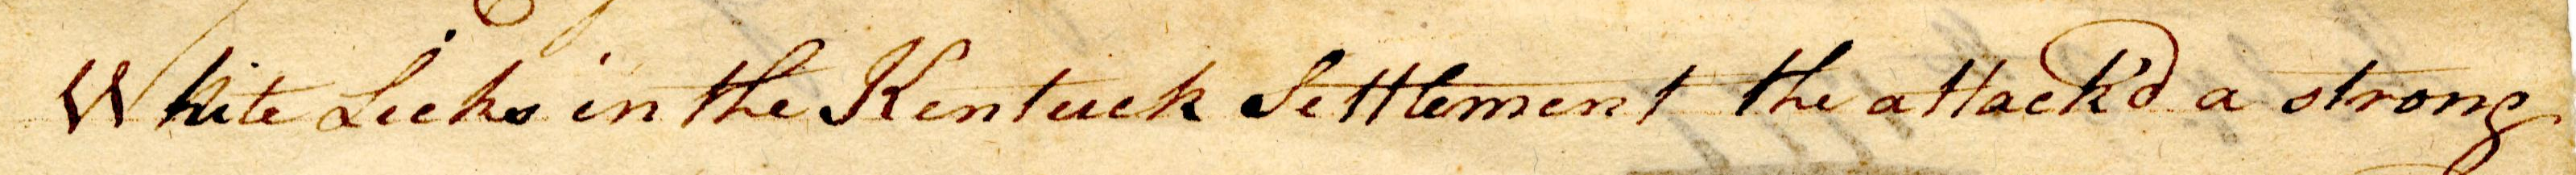White Licks in the Kentuck Settlement the attack'd a strong
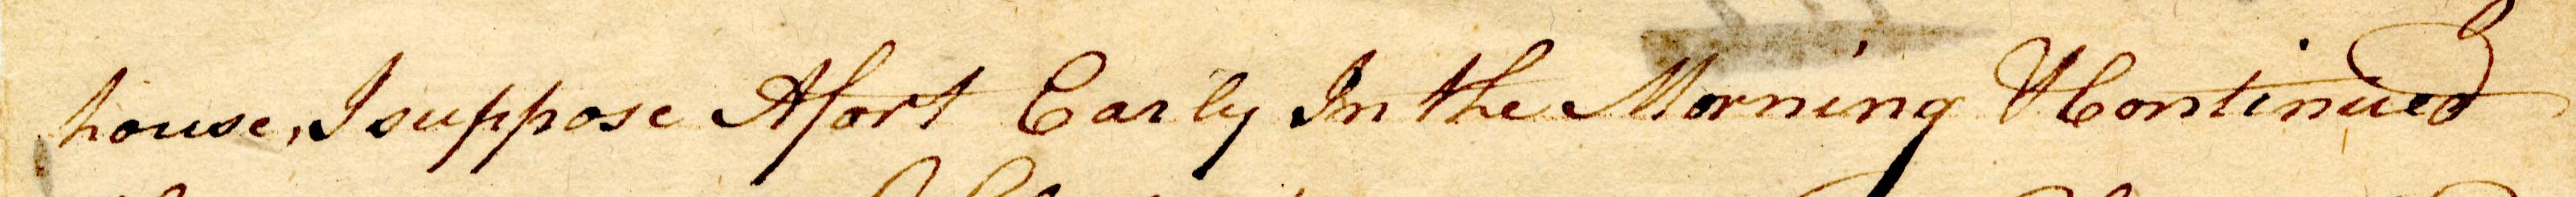house, I suppose A fort Early In the Morning & Continued
